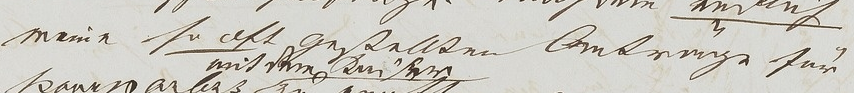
meine so oft gestellten Anträge für
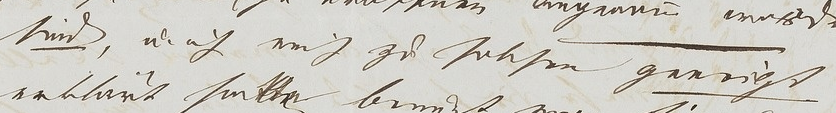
sind u. ich mich zu solchen geneigt
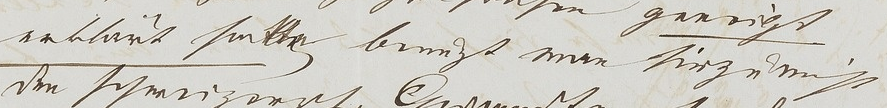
erklärt hatte, benuzt man hierzu nicht
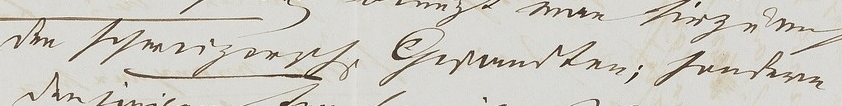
den schweizersch. Gesandten; sondern
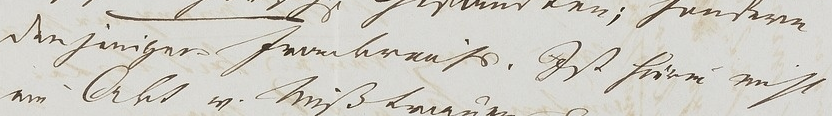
denjenigen Frankreichs. Ist hierin nicht
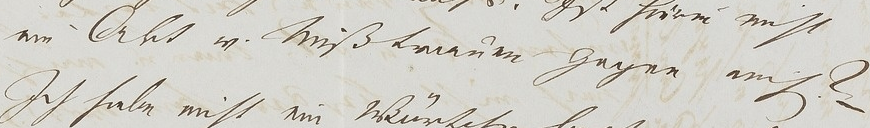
ein Akt v. Mißtrauen gegen mich? –
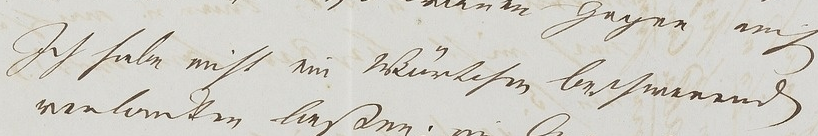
Ich habe nicht ein Wörtchen beschwerend
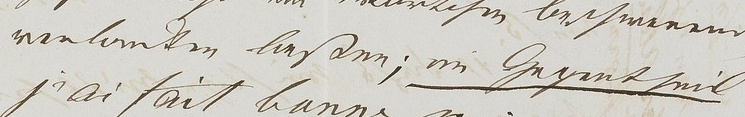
verlauten lassen; im Gegentheil
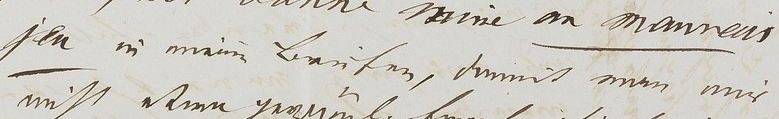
jeu in meinen Briefen, damit man mir
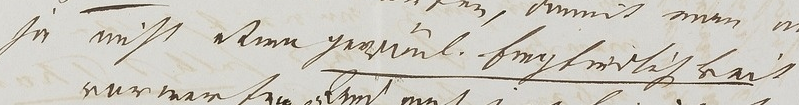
ja nicht etwa gewönl. Empfindlichkeit
